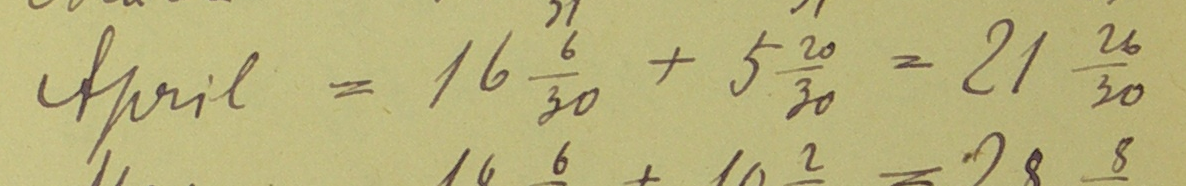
April = 16 6/30 + 5 20/30 = 21 26/30
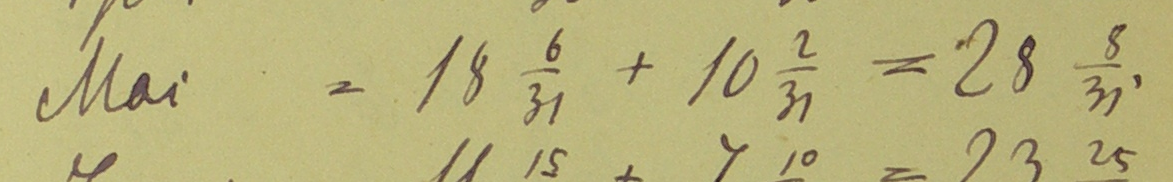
Mai = 18 6/31 + 10 2/31 = 28 8/31
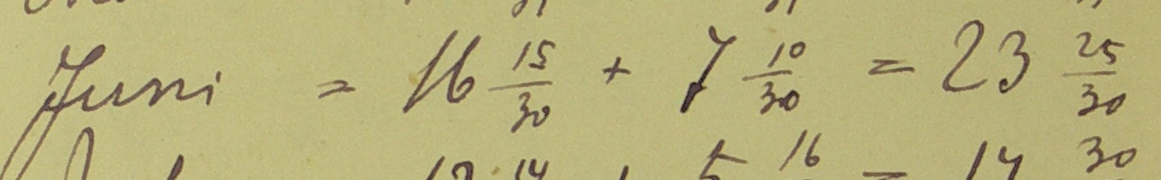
Juni = 16 15/30 + 7 10/30 = 23 25/30
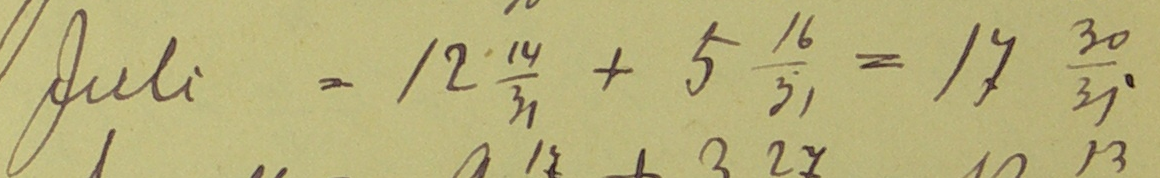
Juli = 12 14/31 + 5 16/31 = 17 30/31
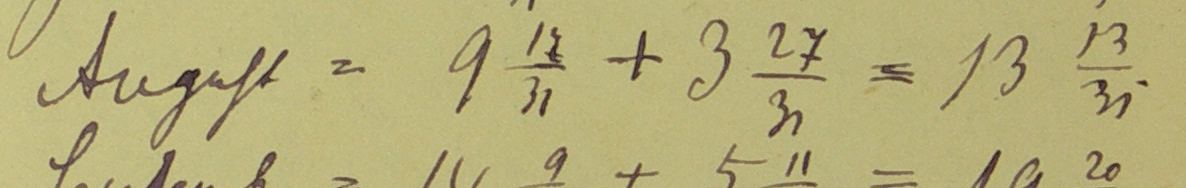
August = 9 17/31 + 3 27/31 = 13 13/31
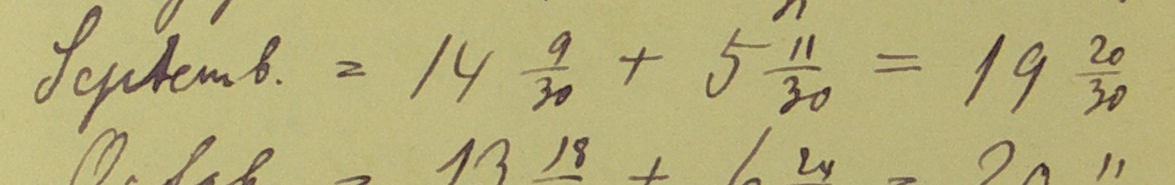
Septem. = 14 9/30 + 5 11/30 = 19 30/30
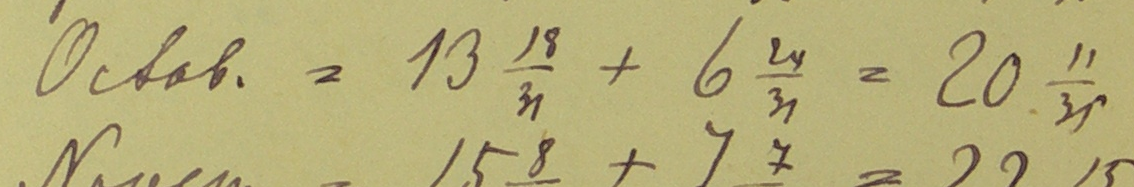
Octob. = 13 18/31 + 6 24/31 = 20 11/31
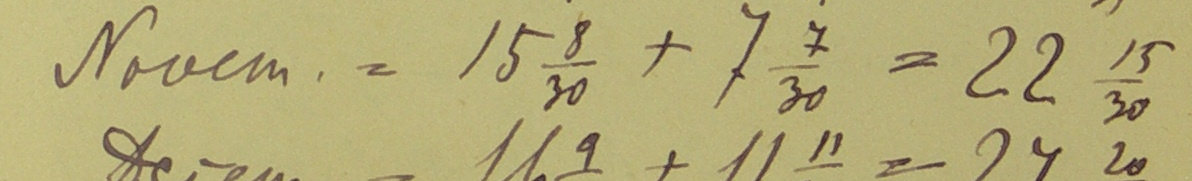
Novem. = 15 8/30 + 7 7/30 = 22 15/30
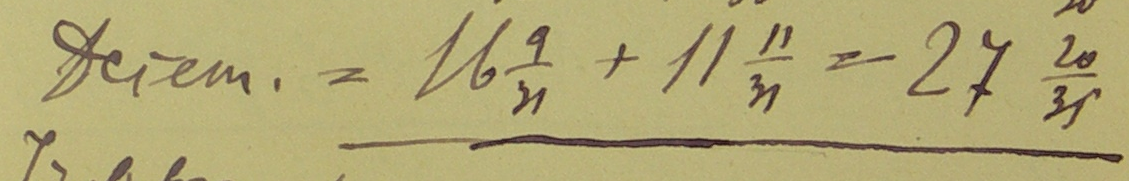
Decem. = 16 9/31 + 11 11/31 = 27 20/31
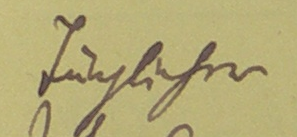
Täglicher
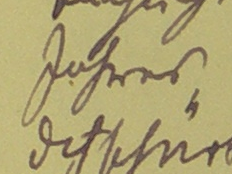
Jahres-
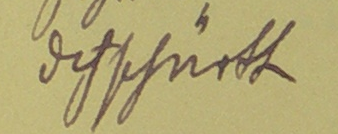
Durchschnitt
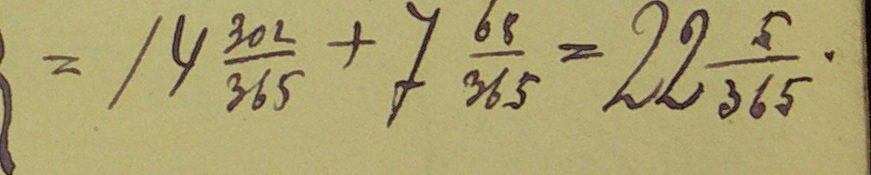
= 14 302/365 + 7 68/365 = 22 5/365
